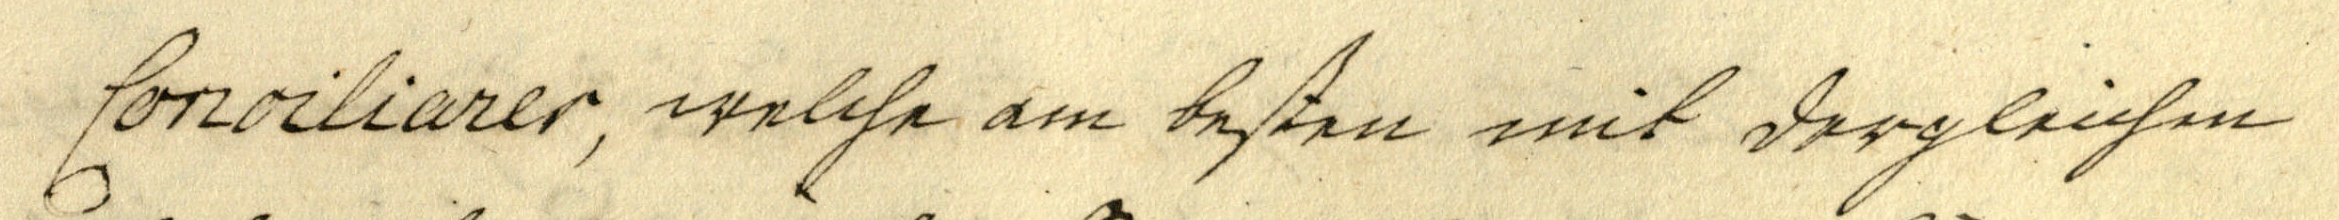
Conciliares, welche am besten mit dergleichen
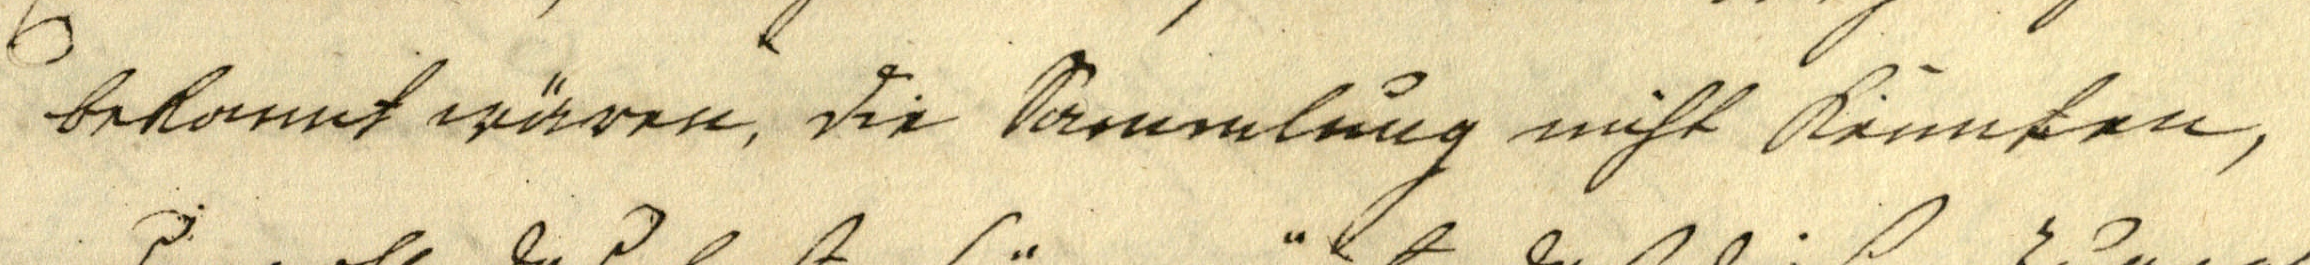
bekannt wären, die Sammlung nicht kennten,
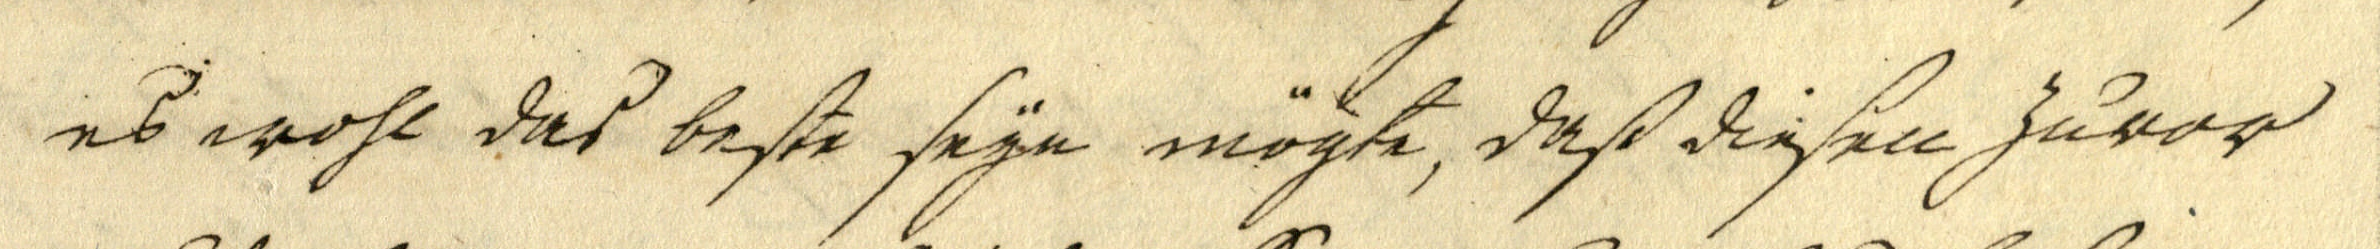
es wohl das beste seyn mögte, daß diesen zuvor
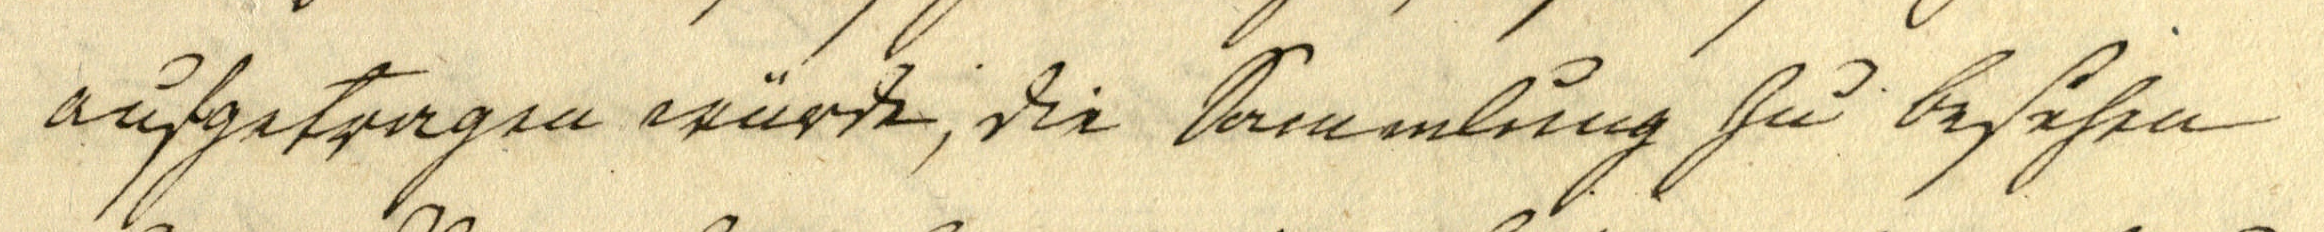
aufgetragen würde, die Sammlung zu besehen
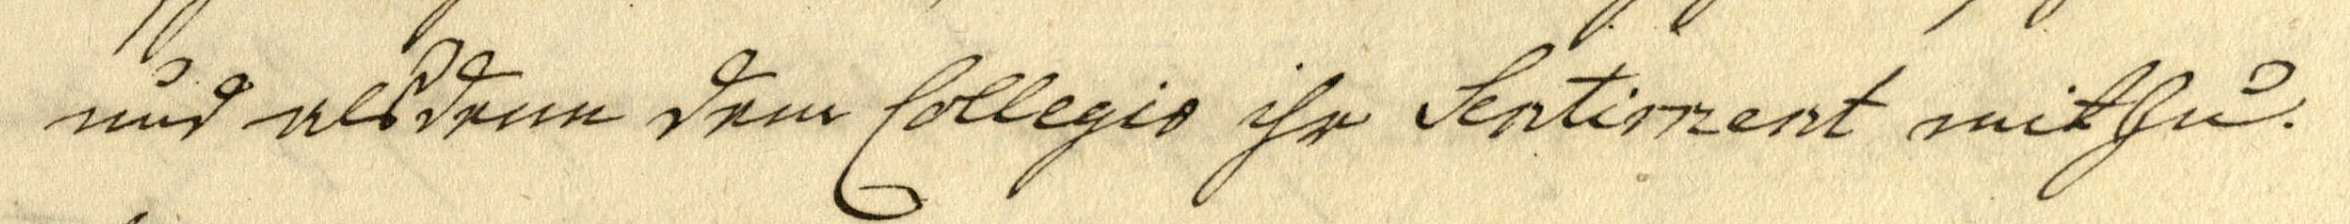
und alsdenn dem Collegio ihr Sentiment mitzu
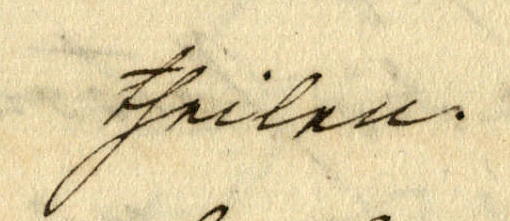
theilen.
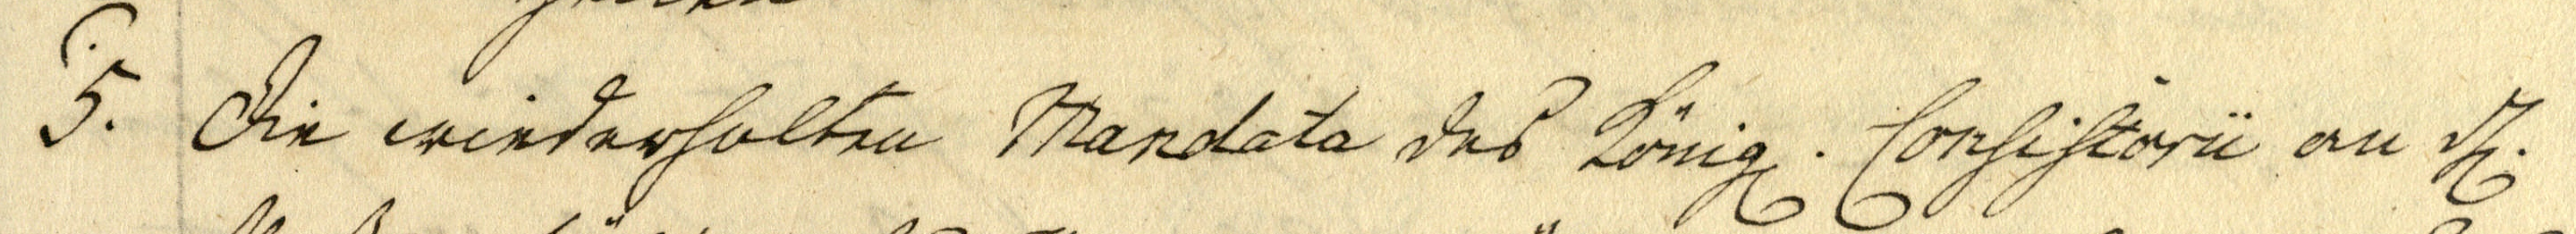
5. Die wiederholten Mandate des Königl. Consistorii an dh.
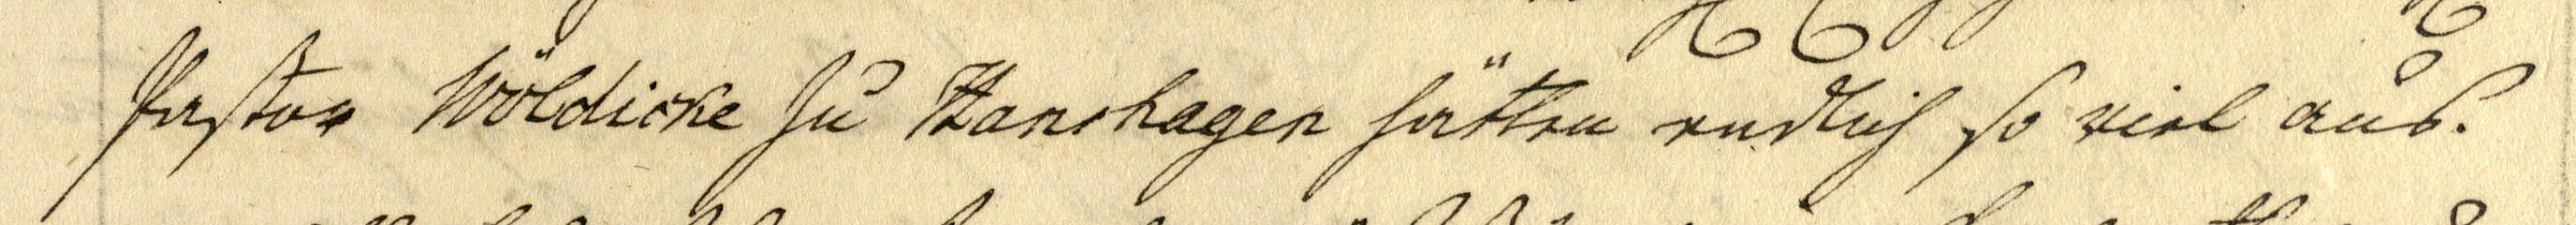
Pastor Wöldicke zu Hanshagen hätten endlich so viel aus-
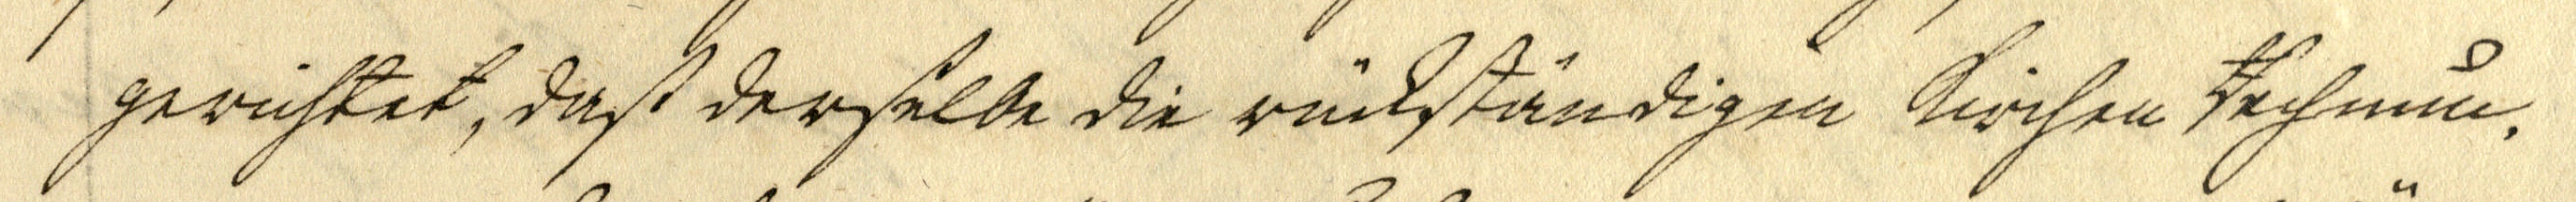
gerichtet, daß derselbe die rückständigen Kirchen Rechnun-
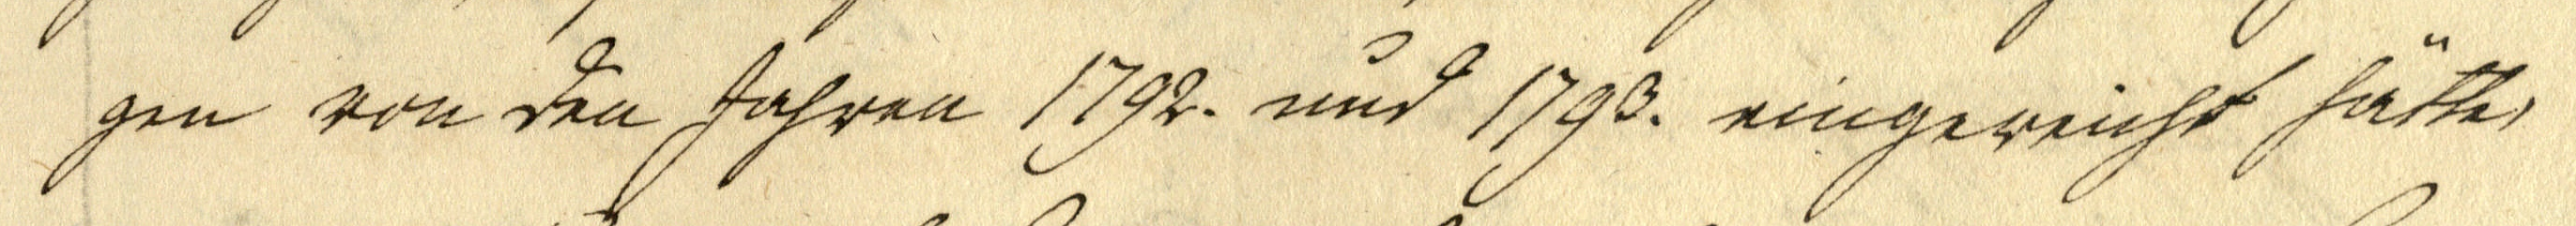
gen von den Jahren 1792 und 1793. eingereicht hätte,
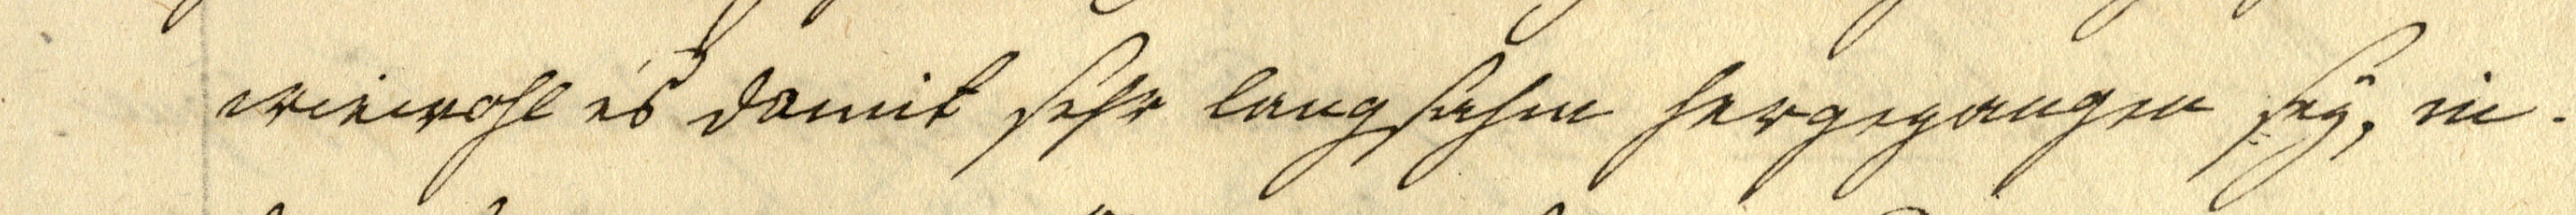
wiewohl es damit sehr langsahm hergegangen sey, in
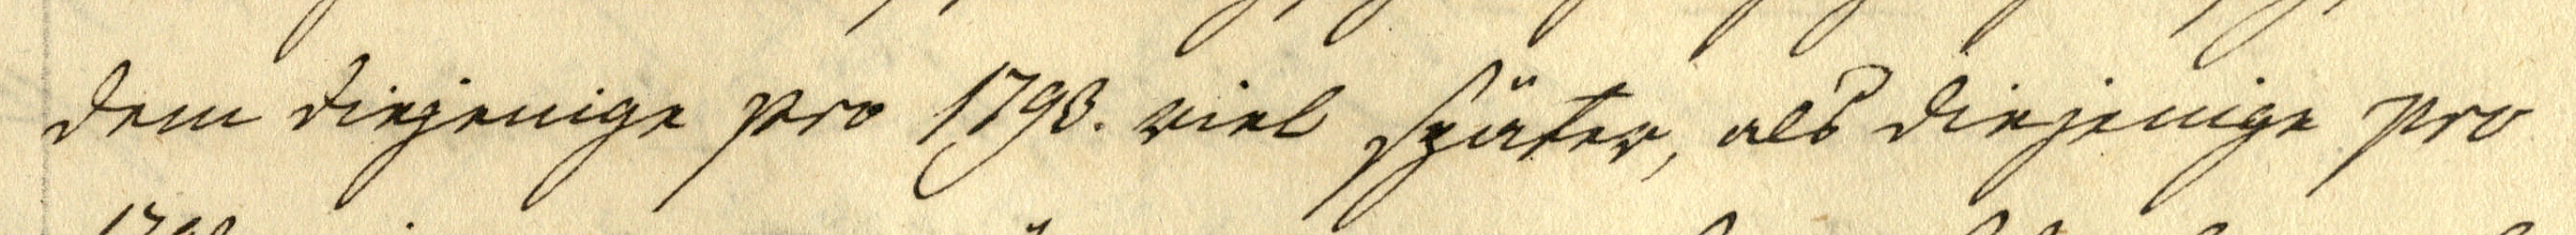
dem diejenige pro 1793 viel später, als diejenige pro
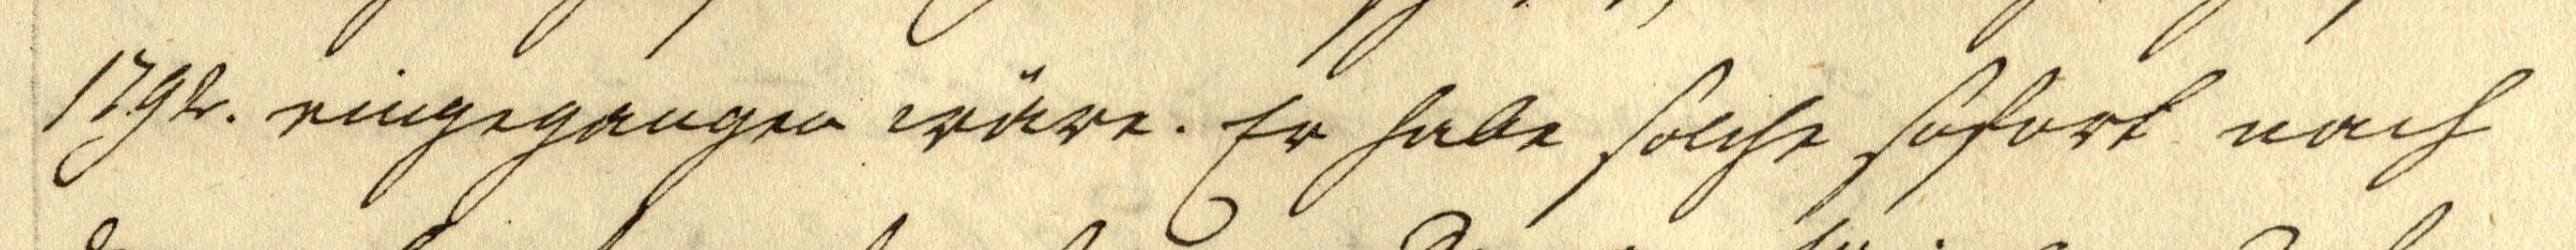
1792. eingegangen wäre. Er habe solche sofort nach
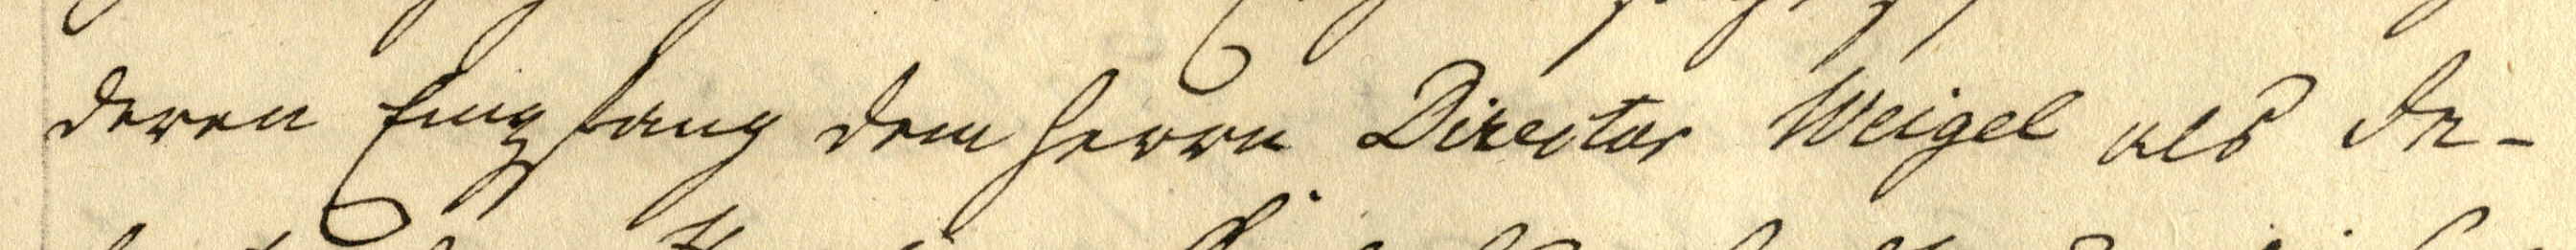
deren Empfang dem herrn Director Weigel als In-
